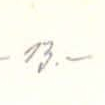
13.
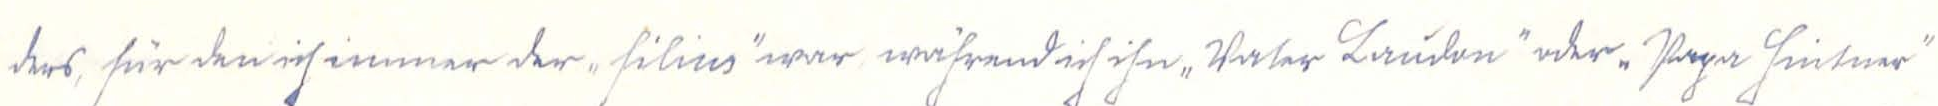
ders, für den ich immer der "filius" war während ich ihn "Vater Laudon" oder " Papa Hintner"
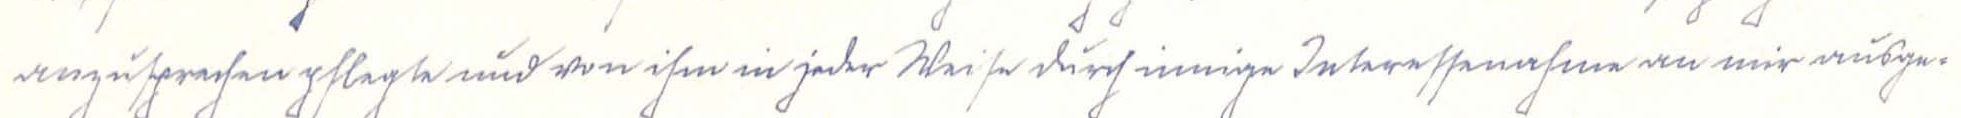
anzusprechen pflegte und von ihm in jeder Weise durch innige Interessenahme an mir ausge-
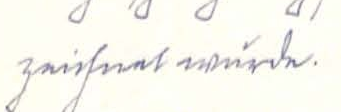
zeichnet wurde.
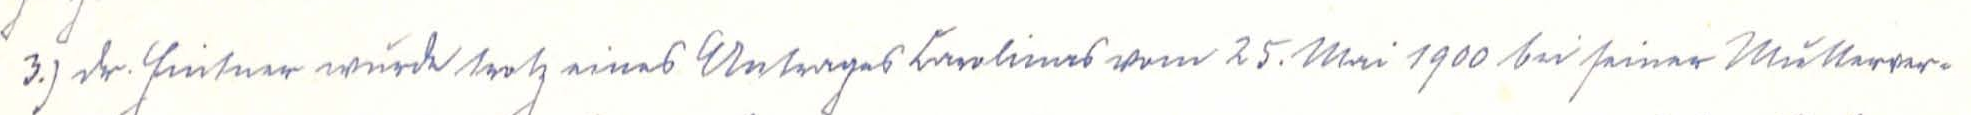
3.) Dr. Hintner wurde trotz eines Antrages Carolinas vom 25. Mai 1900 bei seiner Mutterver-
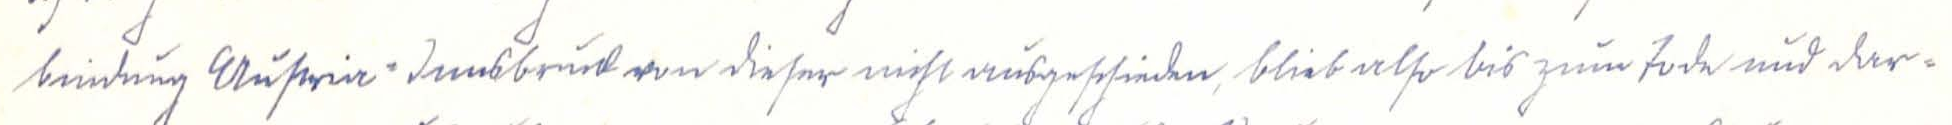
bindung Austria-Innsbruck von dieser nicht ausgeschieden, blieb also bis zum Tode und dar-
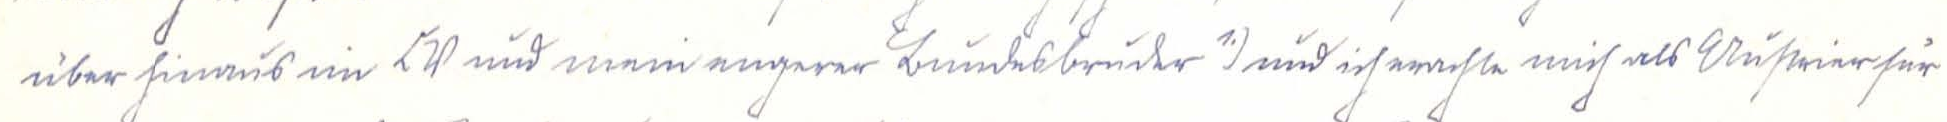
über hinaus im CV und mein eigener Bundesbruder 1.) und ich erachte mich als Austrier für
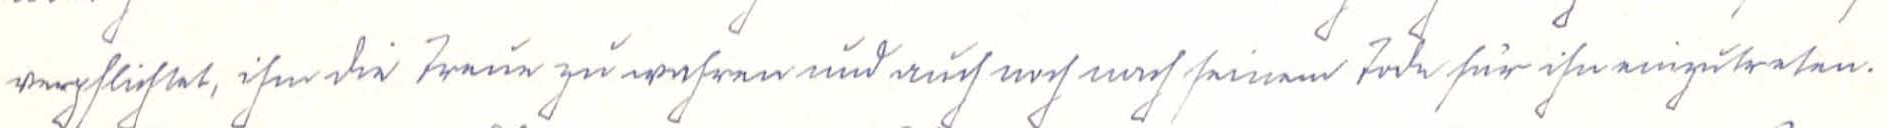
verpflichtet, ihm die Treue zu wahren und auch noch nach seinem Tode für ihn einzutreten.
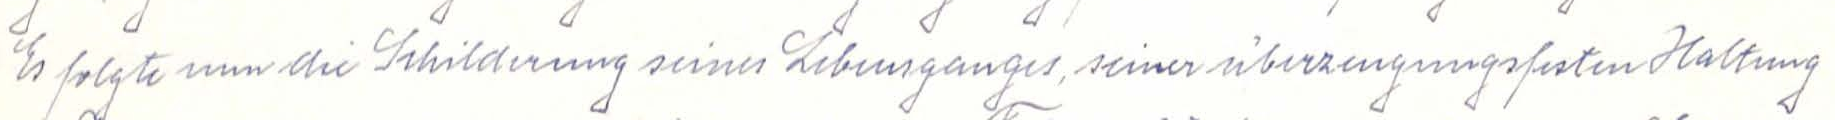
Es folgte nun die Schilderung seines Lebensganges, seiner überzeugungsfesten Haltung
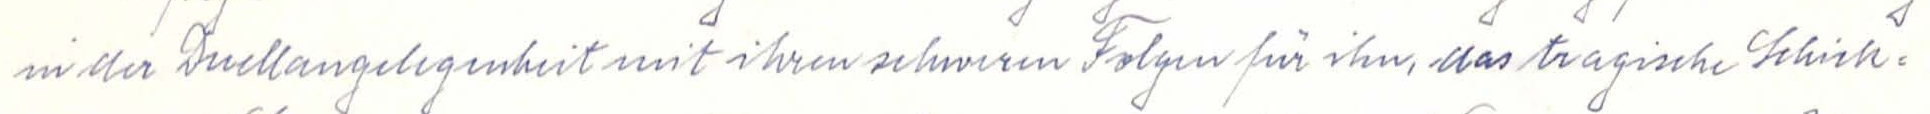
in der Duellangelegenheit mit ihren schweren Folgen für ihn, das tragische Schick-
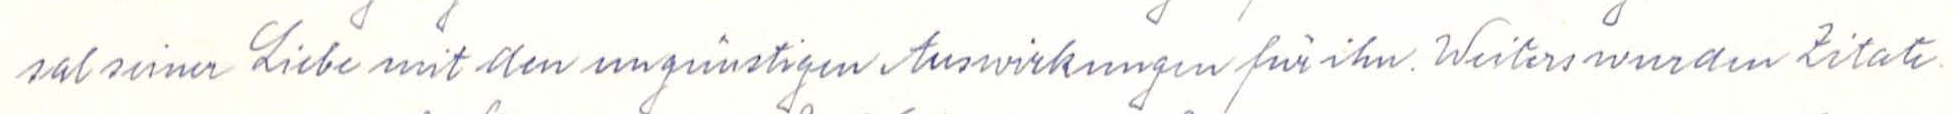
sal seiner Liebe mit den ungünstigen Auswirkungen für ihn. Weiter wurden Zitate
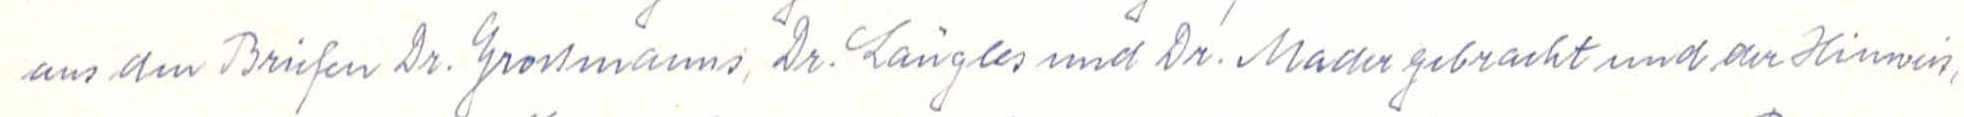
aus den Briefen Dr. Grossmanns, Dr. Längles und Dr. Mader gebracht und der Hinweis,
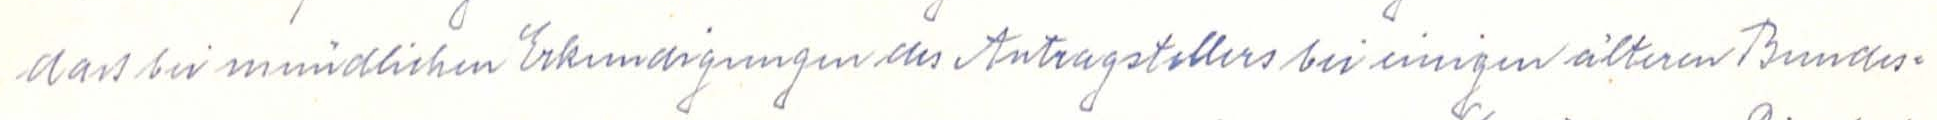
dass bei mündlichen Erkundigungen des Antragstellers bei einigen älteren Bundes-
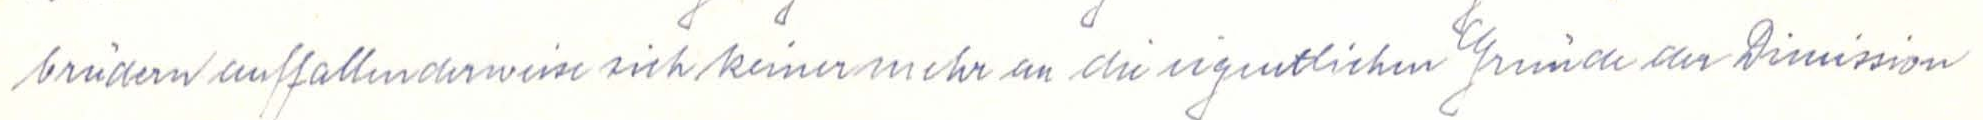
brüdern auffallenderweise sich keiner mehr an die eigentlichen Gründe der Dimissiom
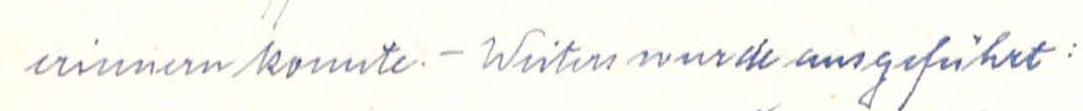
erinnern konnte.- Weiters wurd ausgeführt:
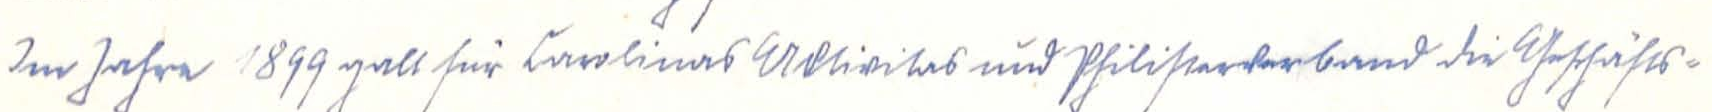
Im Jahre 1899 galt für Carolinas Aktivitas und Philisterverband die Geschäfts-
